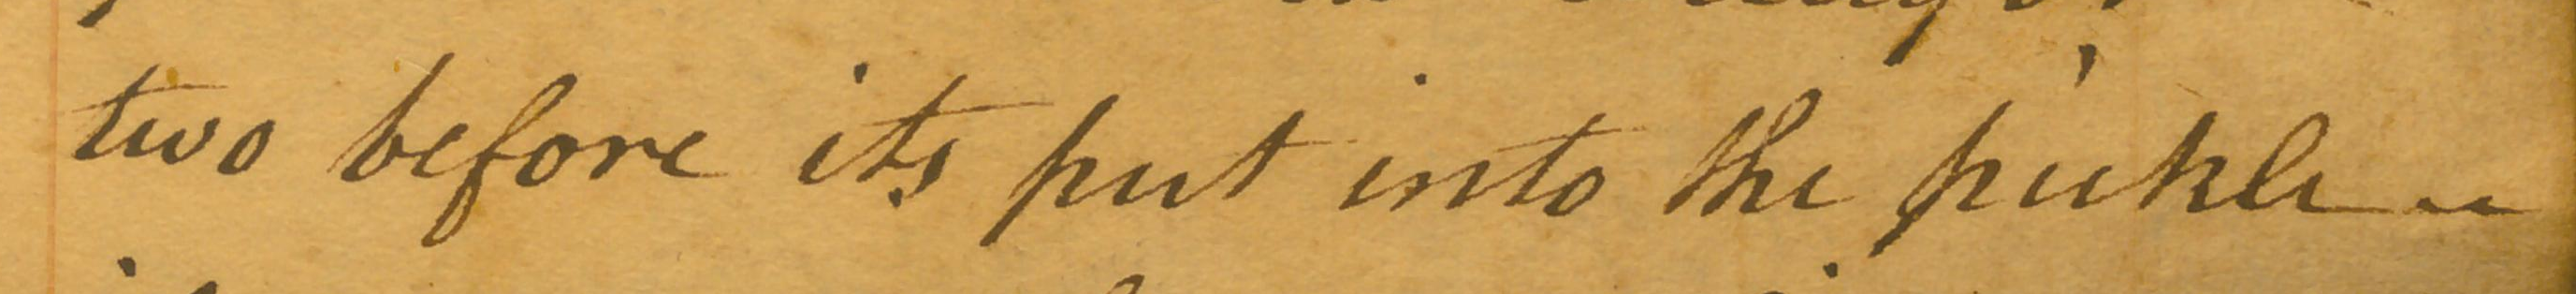two before its put into the pickle-
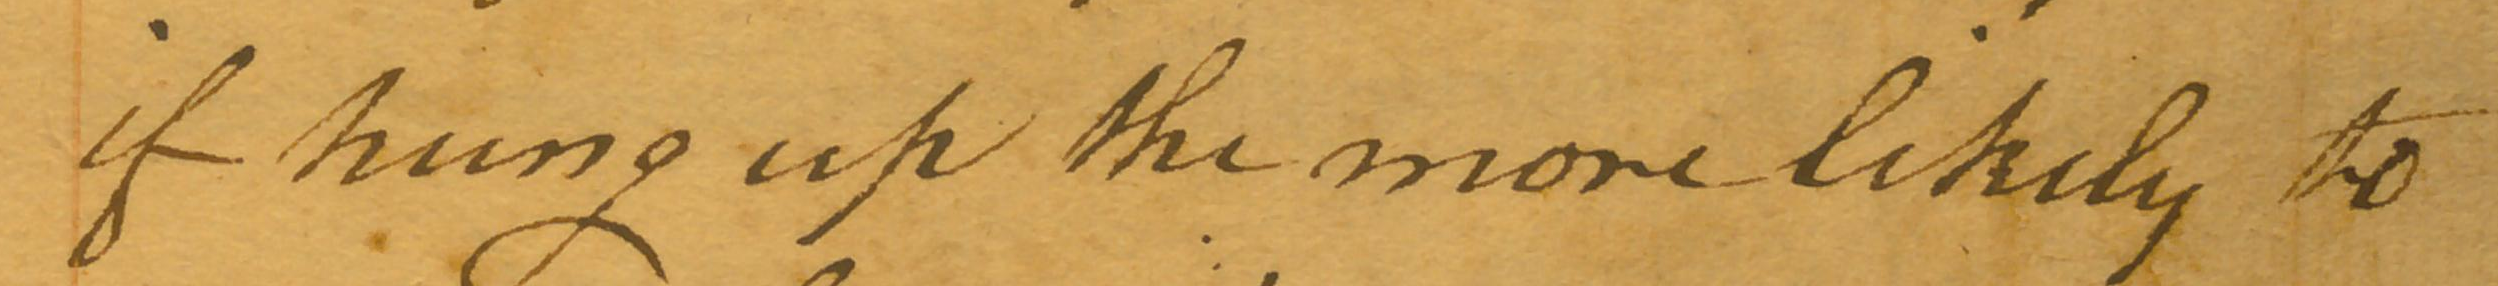if hung up the more likely to
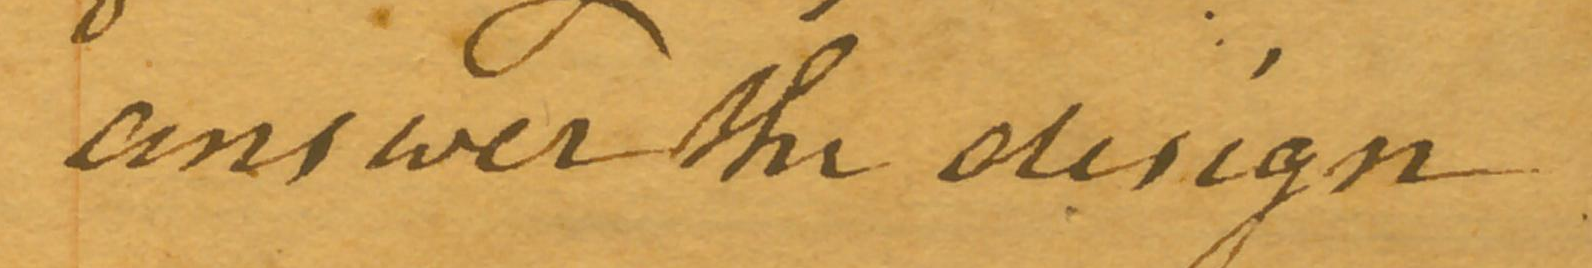answer the design
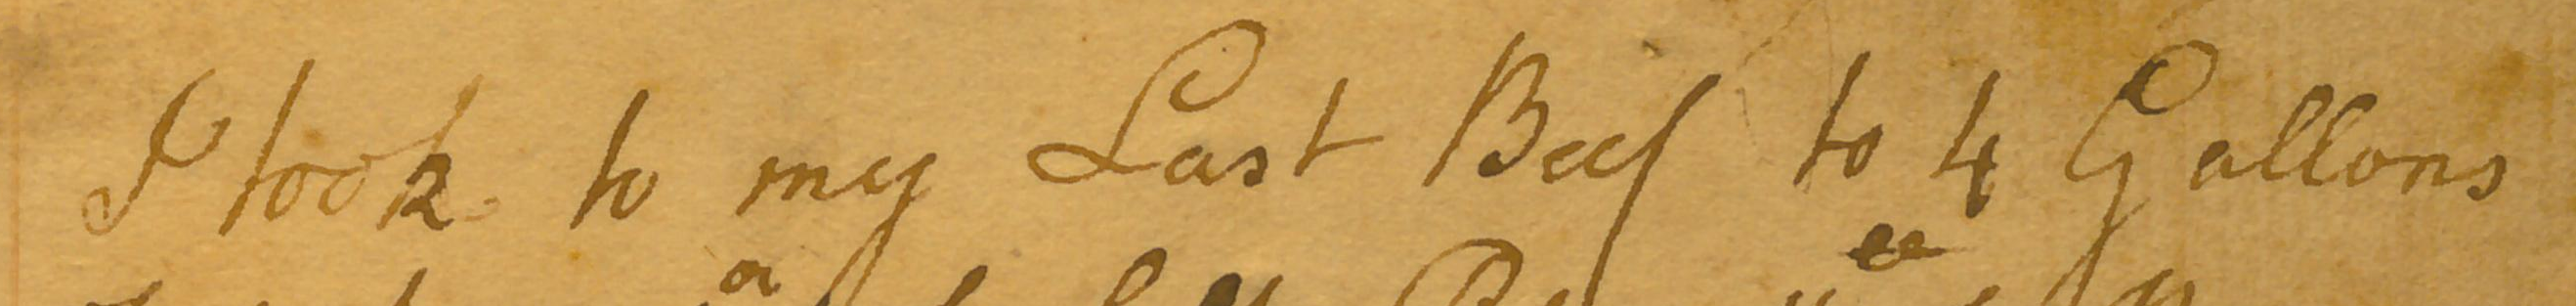I took my Last Beef to 4 Gallons
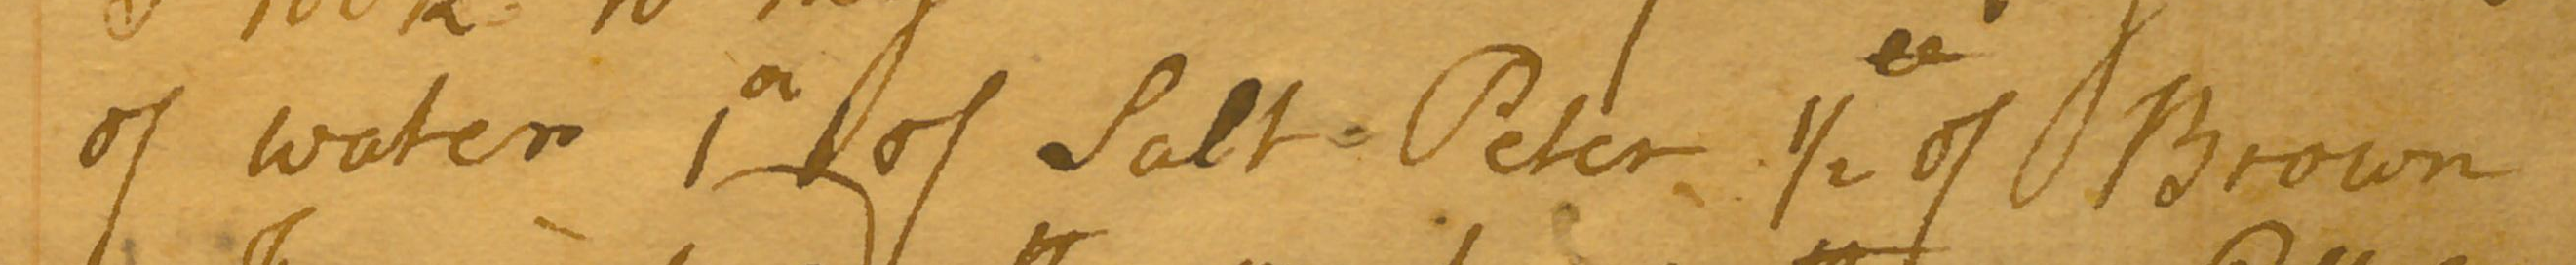if water 1 ^oz of Salt Peter 1/2 ^lb of Brown
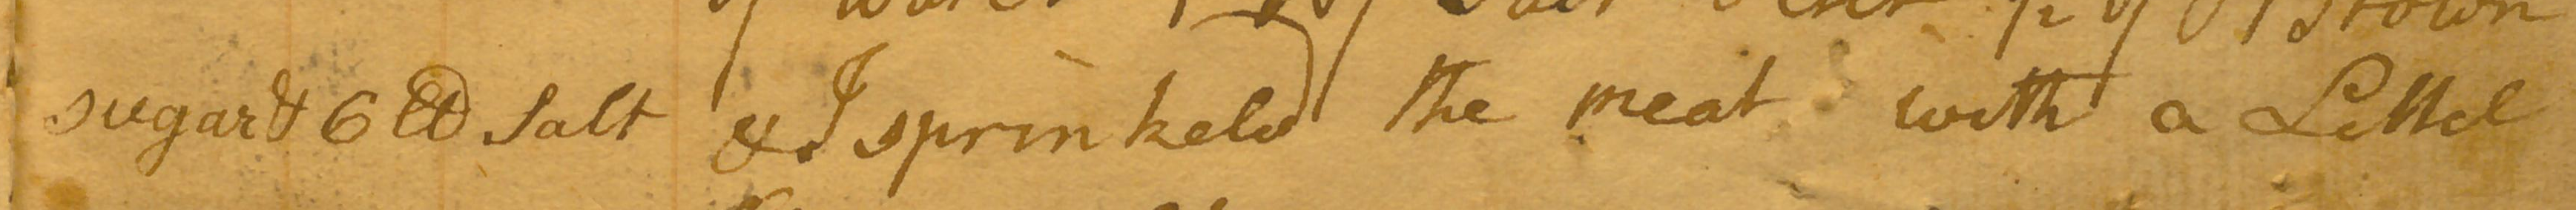sugar & 6 lb salt & I sprinkled the meat with a Littel
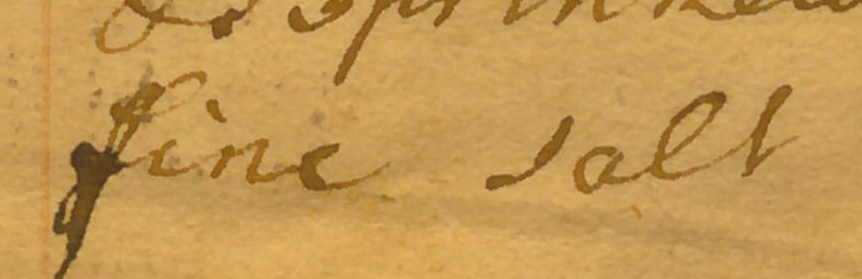fine salt
